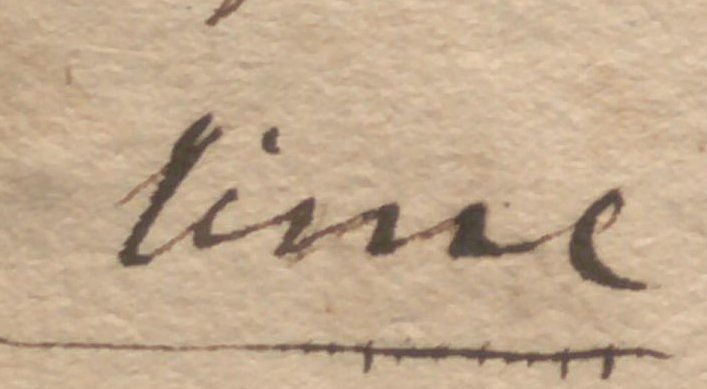time
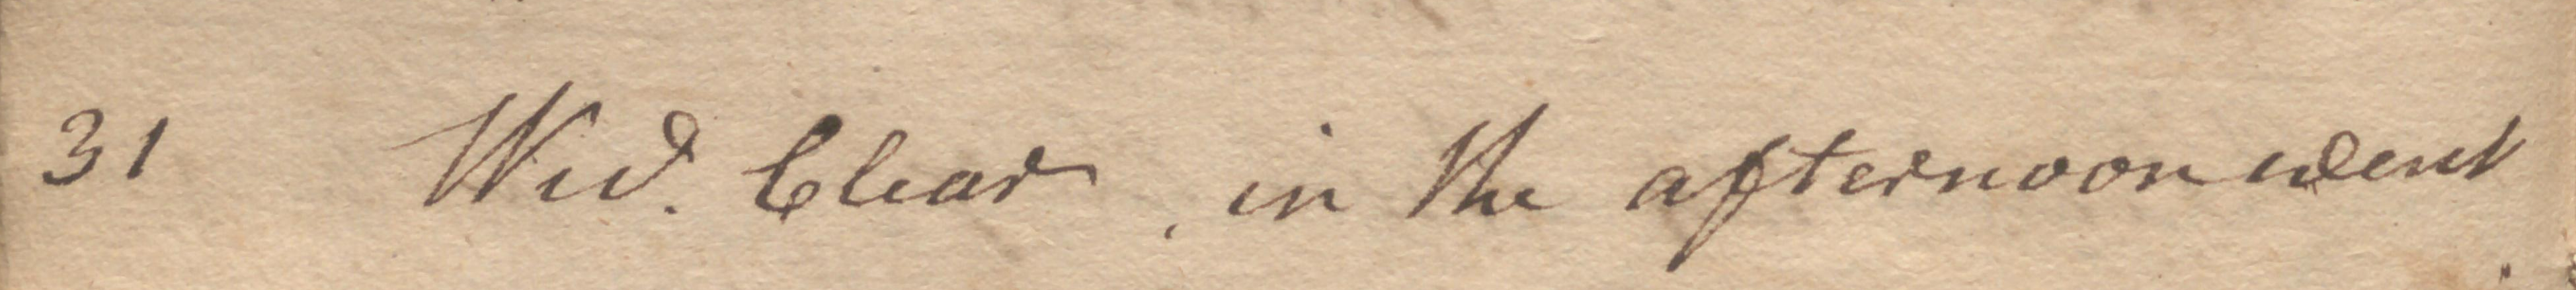31 Wed. Clear in the afternoon went
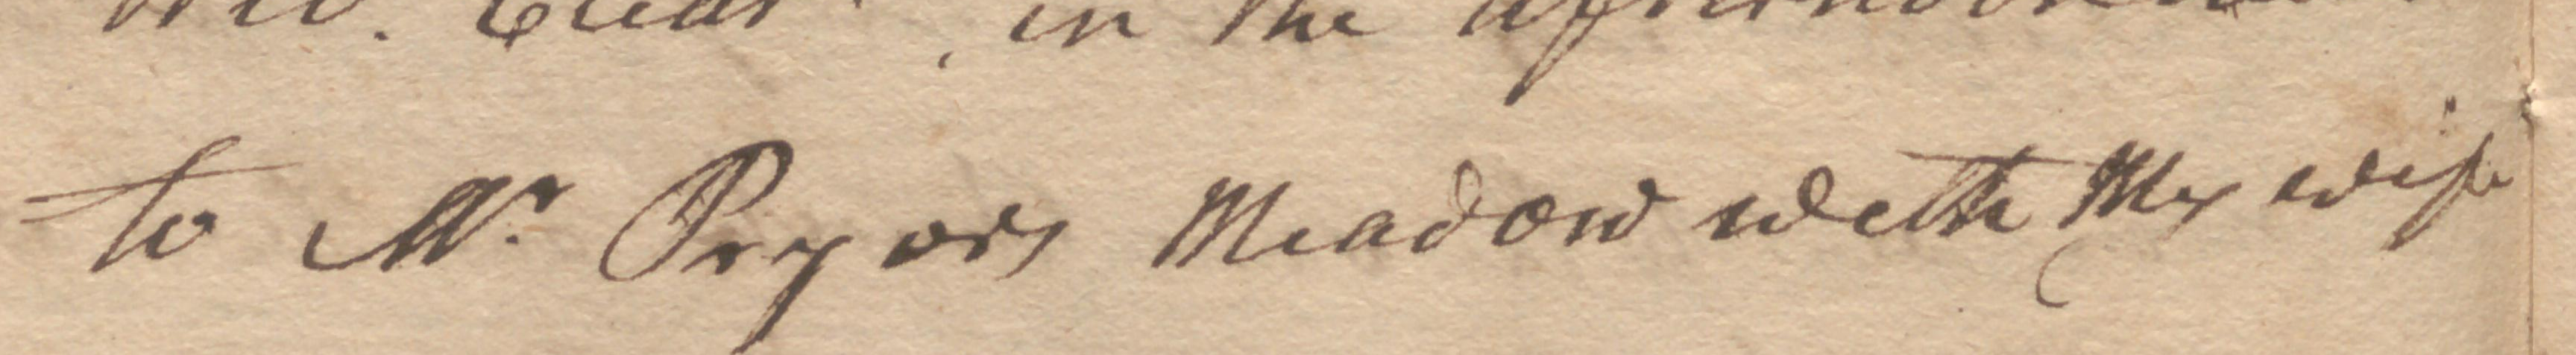to M^r. Pryors Meadow with My wife
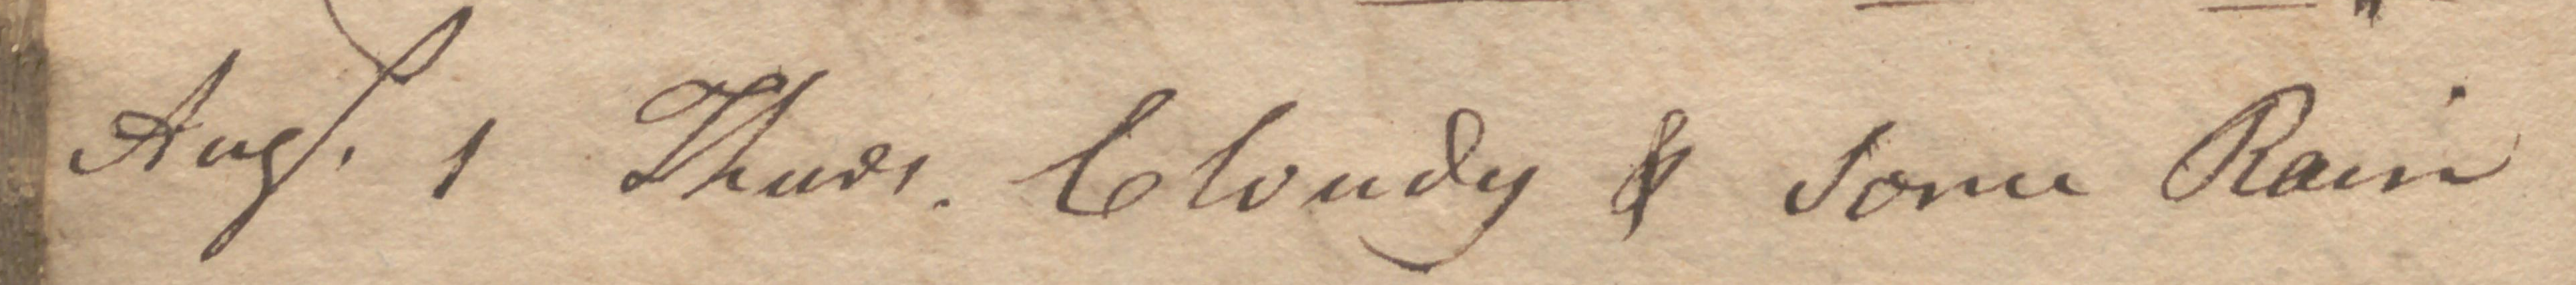Aug^t. 1 Thars. Cloudd, & some Rain
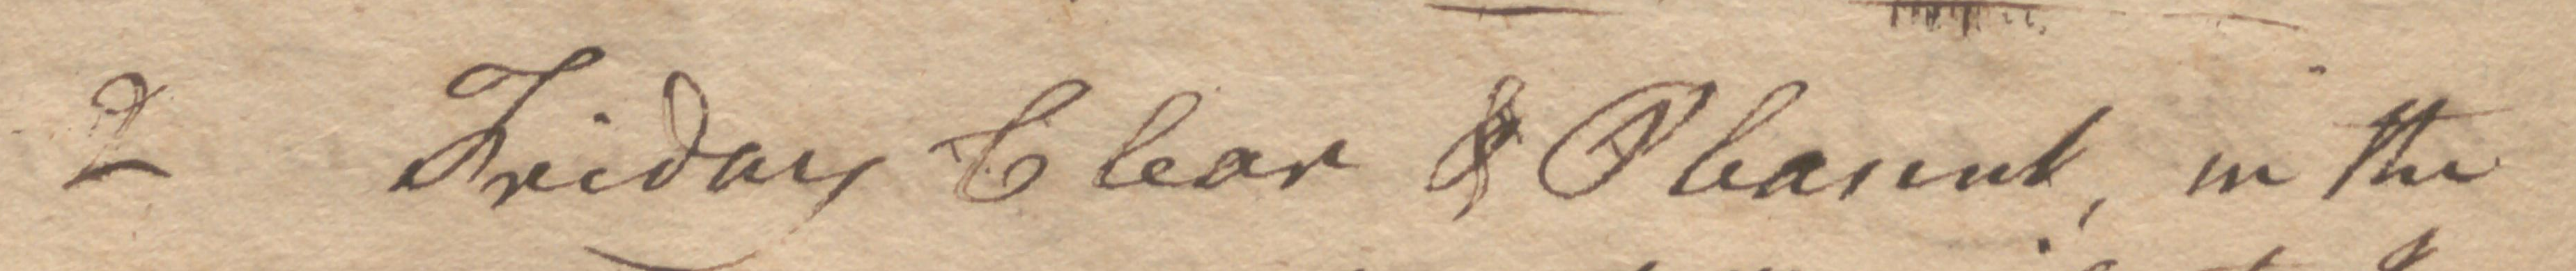2 Friday Clear & Pleasent in the
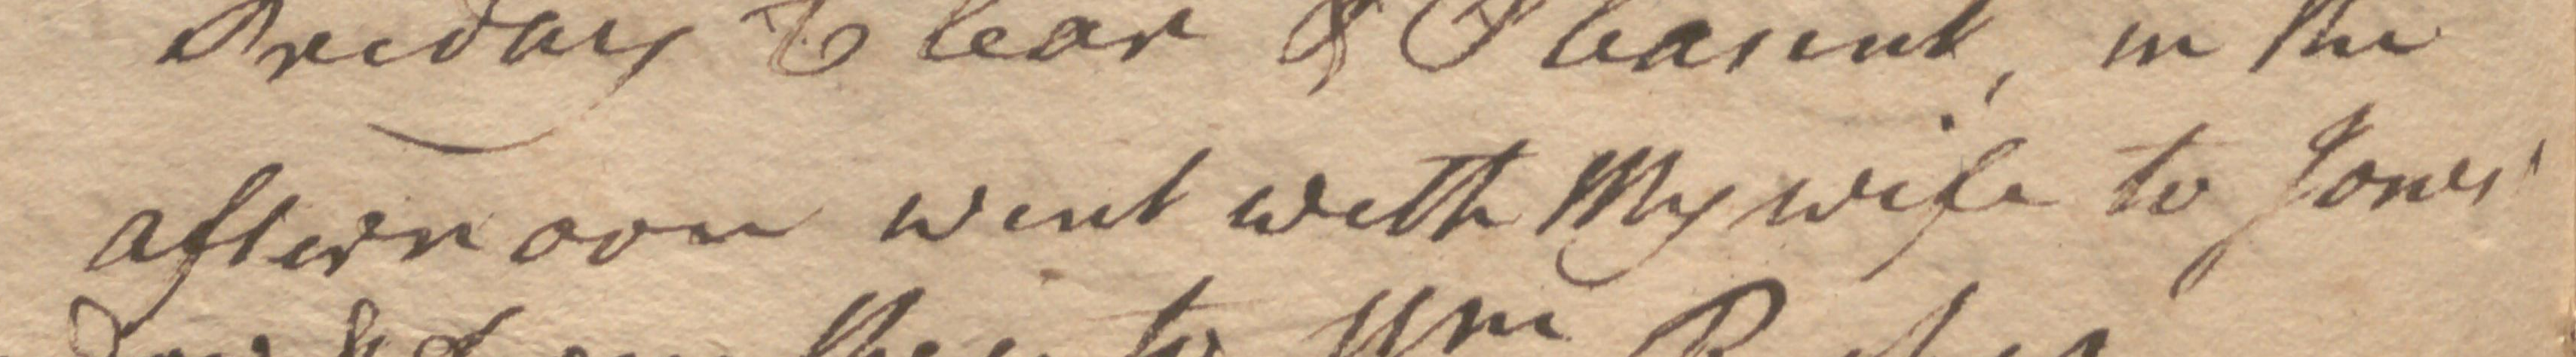afternoon went with My wife to Jones
